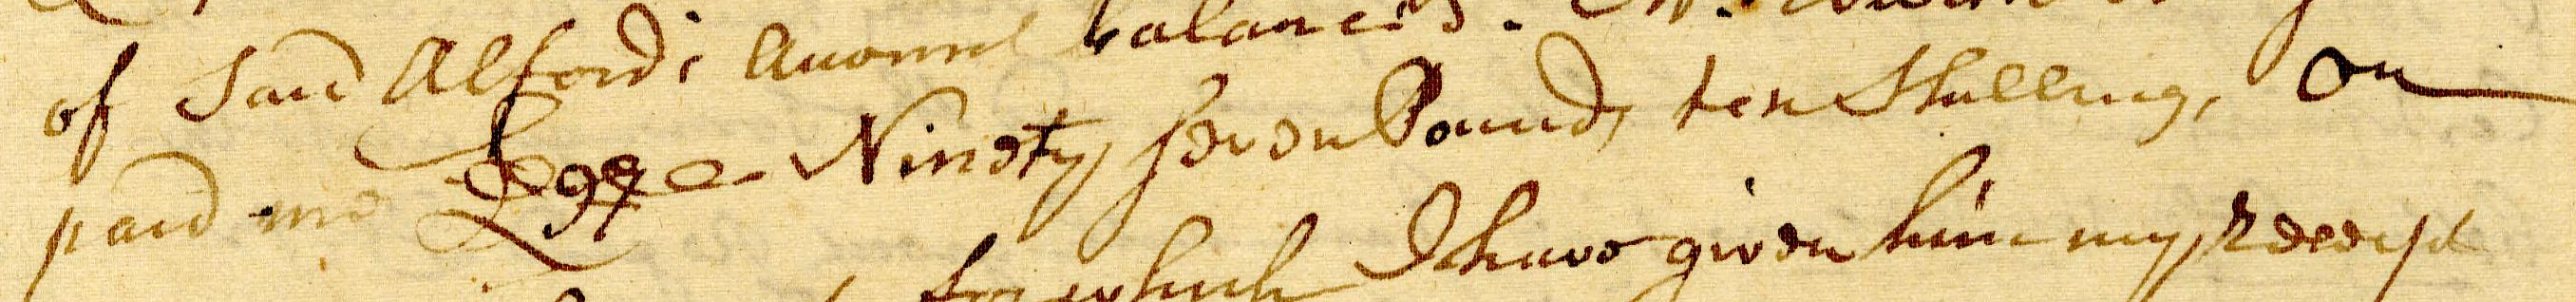paid me £970- Ninety seven Pounds ten shillings, On
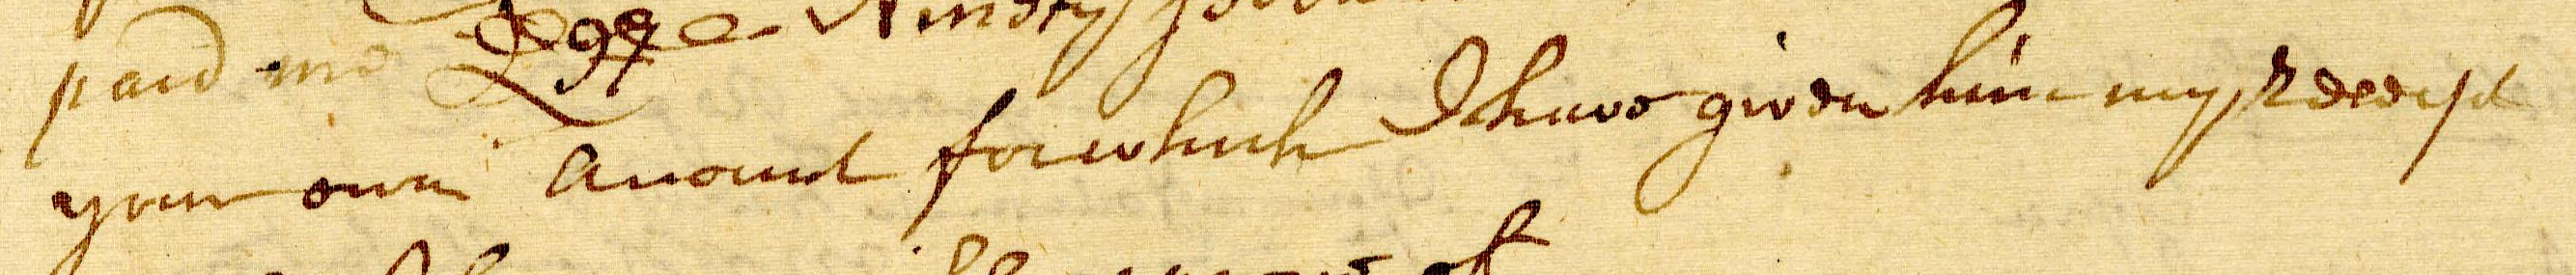your own Account for which I have given him my receipt
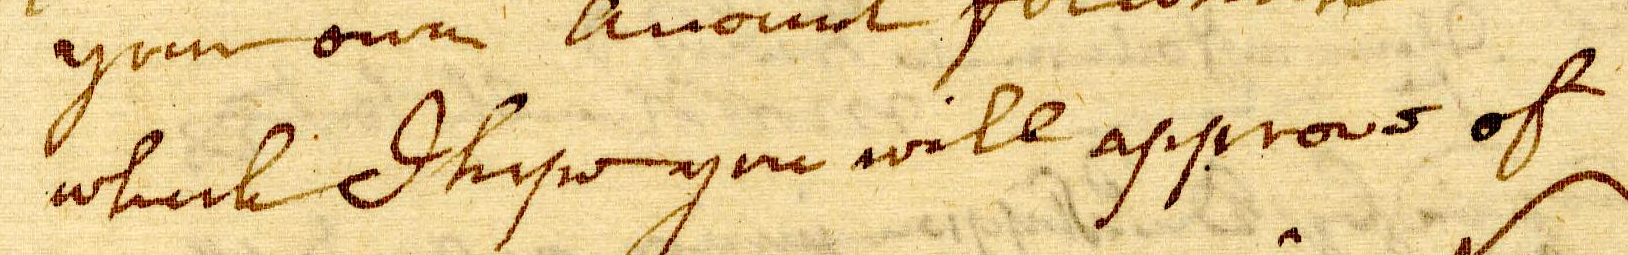which I hope you will approve of
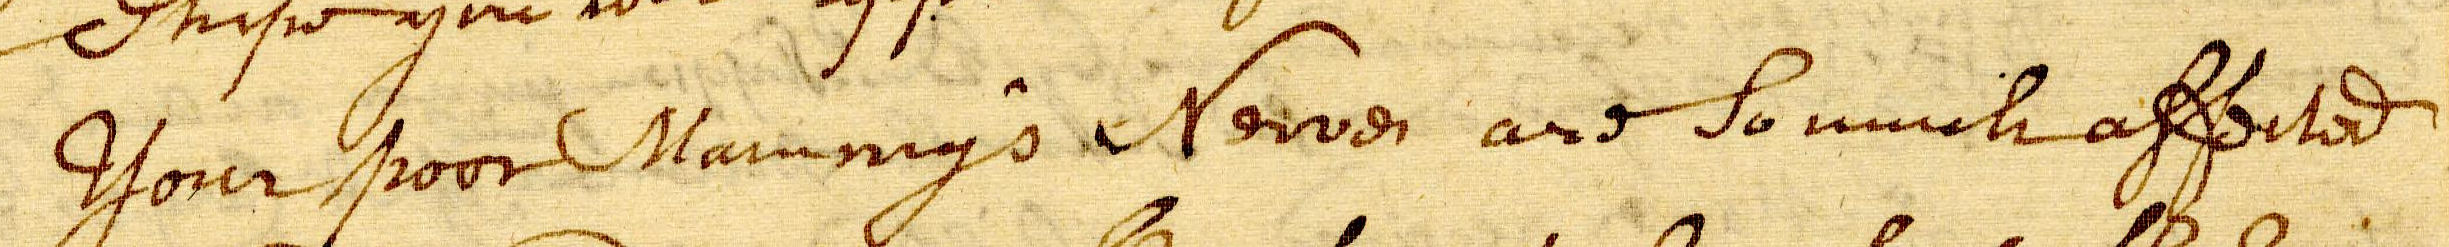Your poor Mammy's Nerves are so much affected
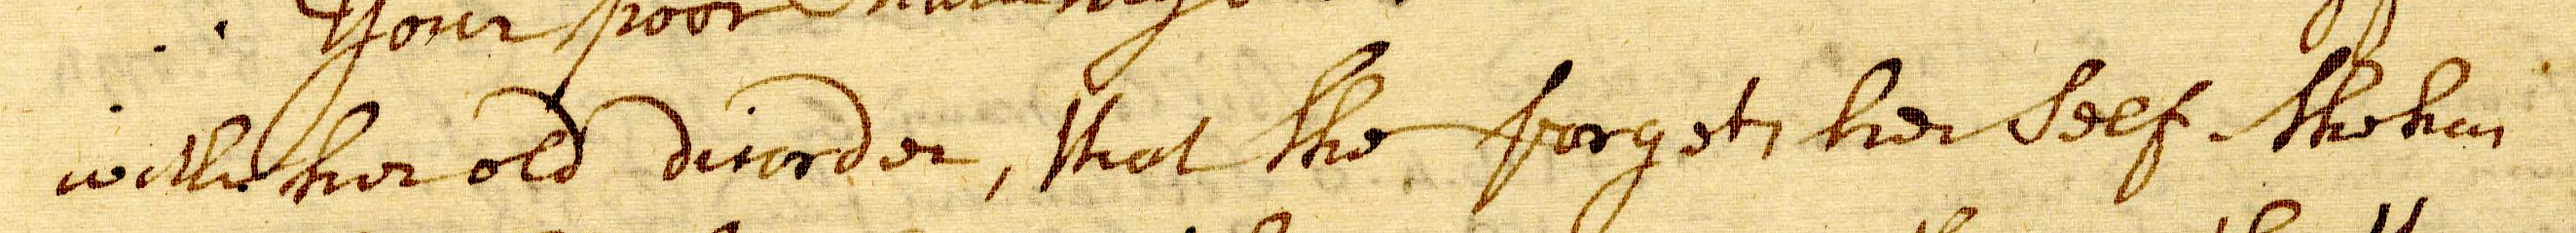with her old disorder, that she forgets her Self She has
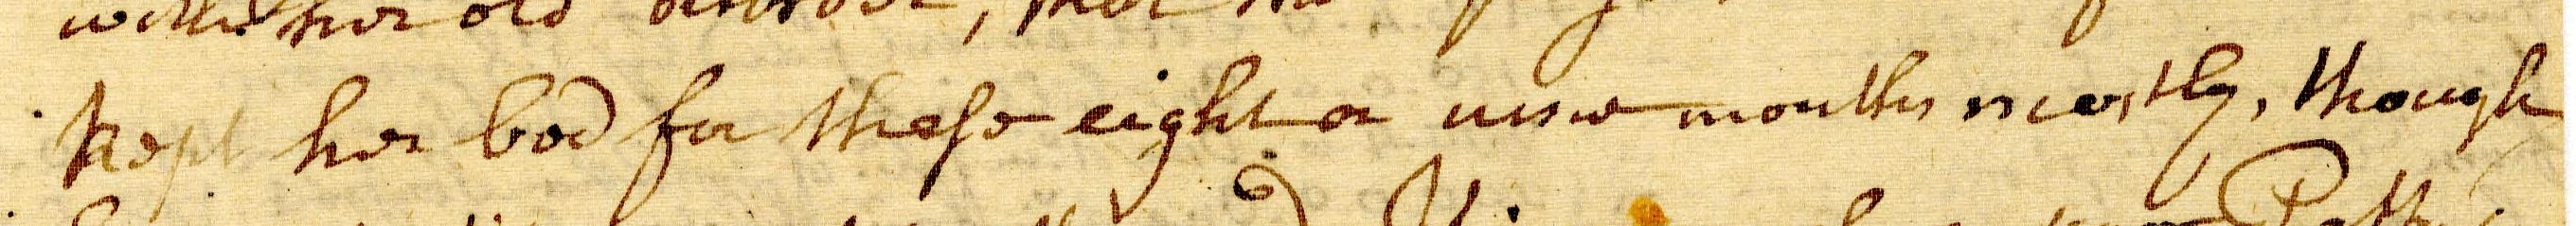kept her bed for these eight or nine months mostly, though
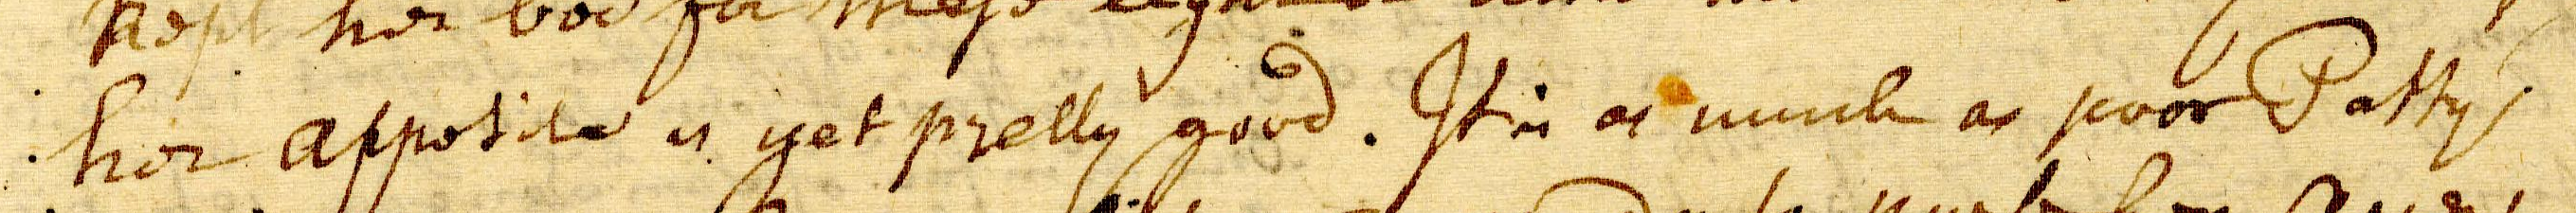her appetite is yet pretty good. It is as much as poor Patty
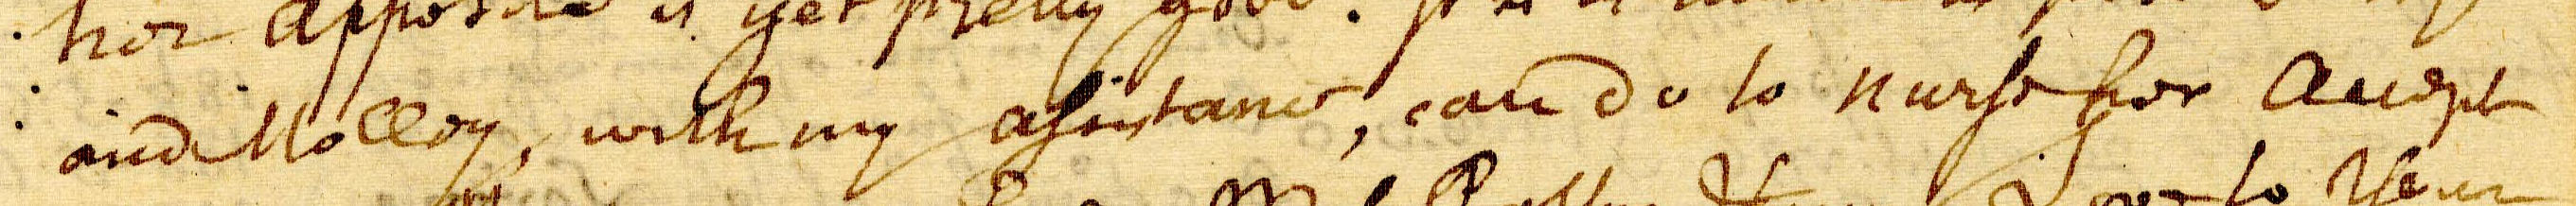and Molley, with my assistance, can do to nurse her Accept
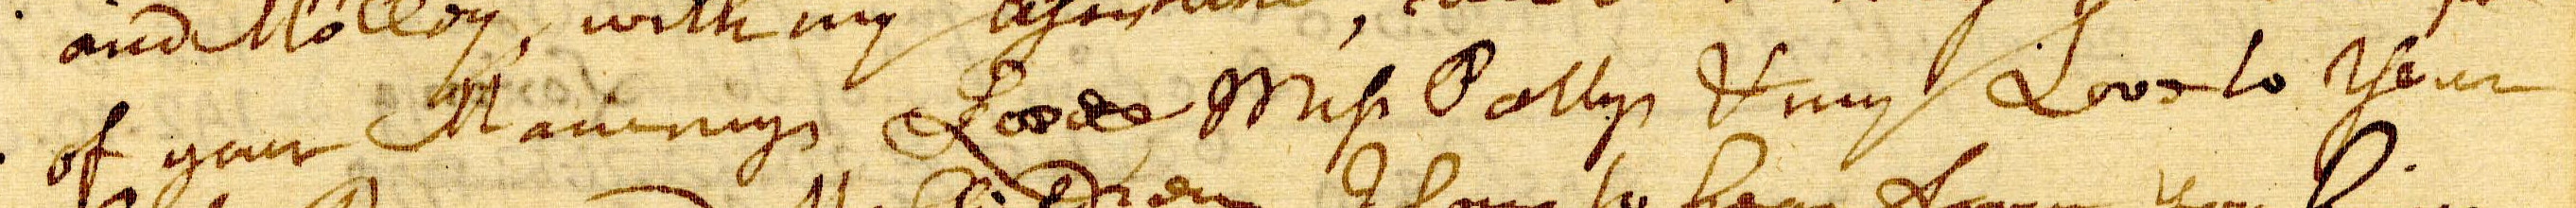of your Mammys Love Miss Pattys & my Love to Your
